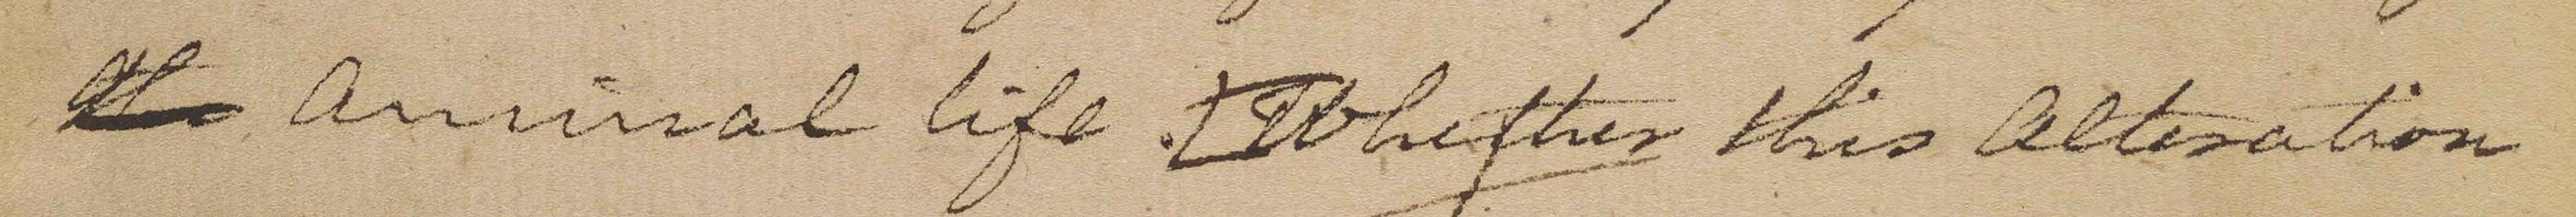Animal life. (Whether this alteration
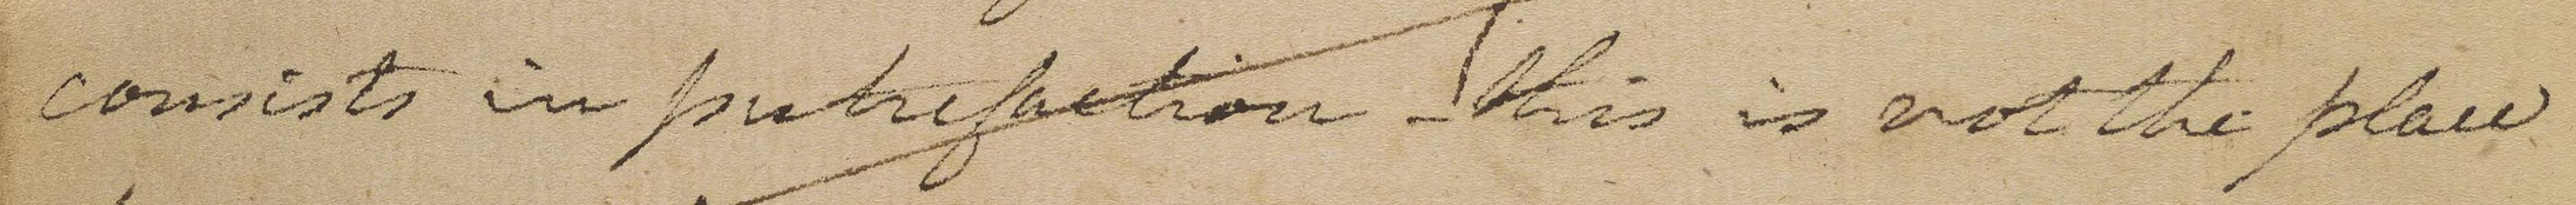consists in putrefaction- this is not the place
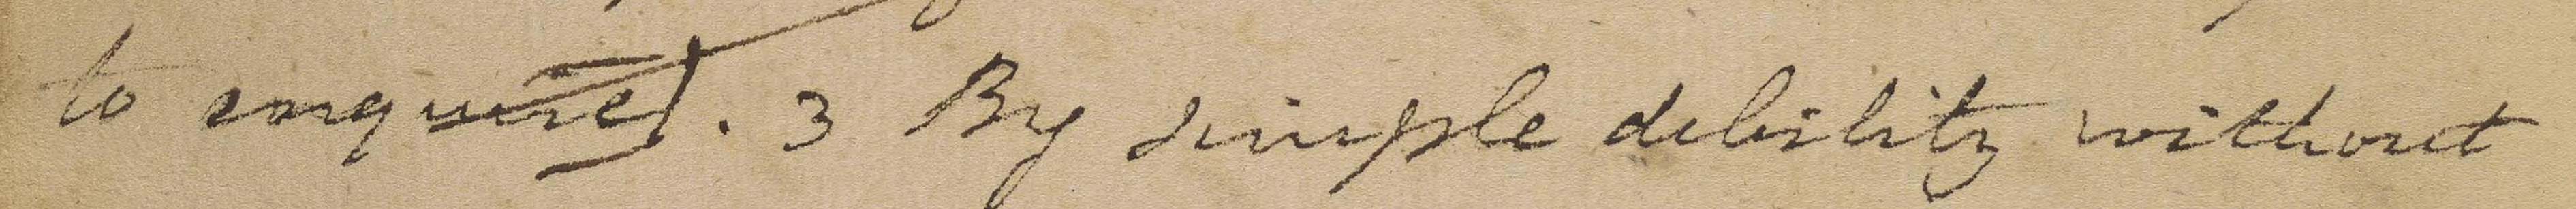to enquire). 3 By simple debility without
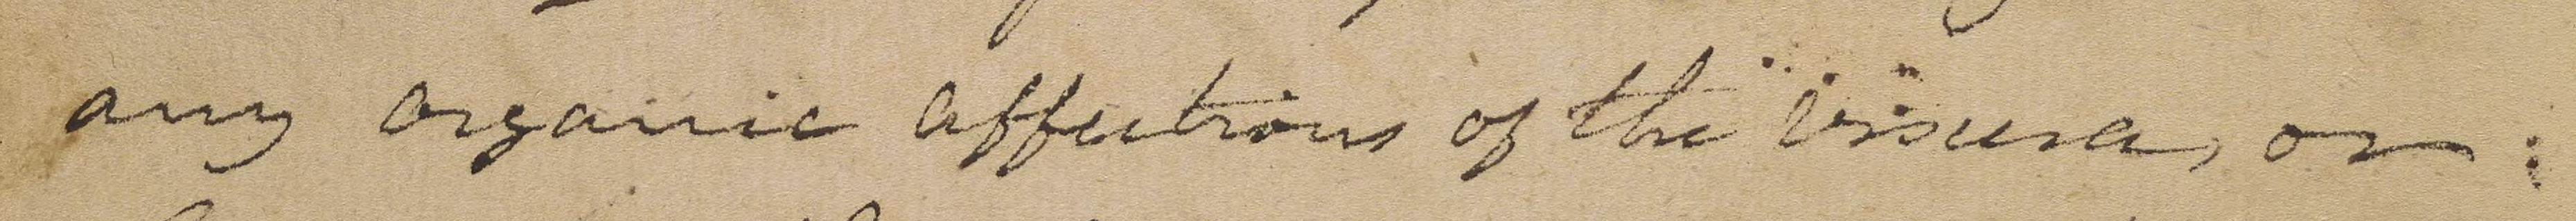any organic affections of the viscera or
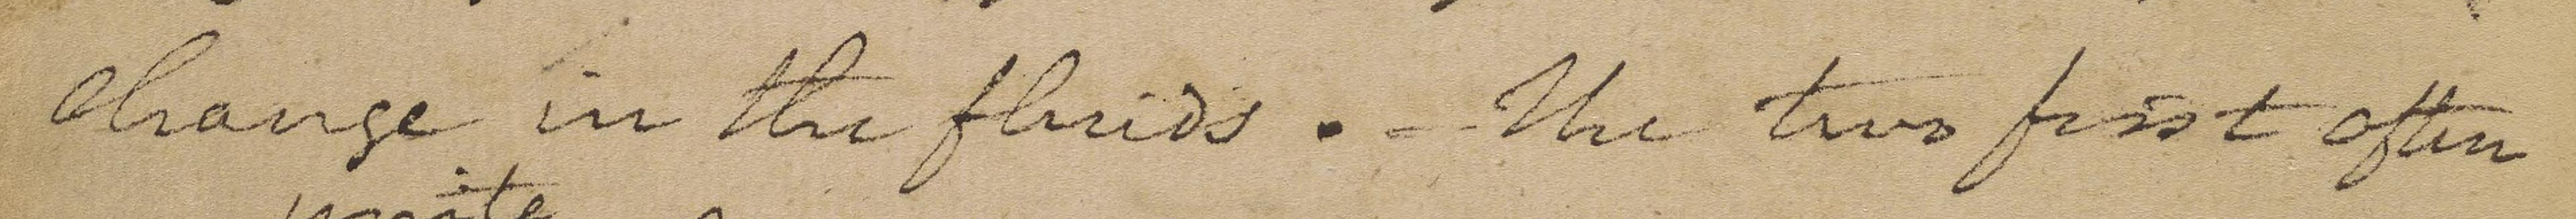change in the fluids. The two first often
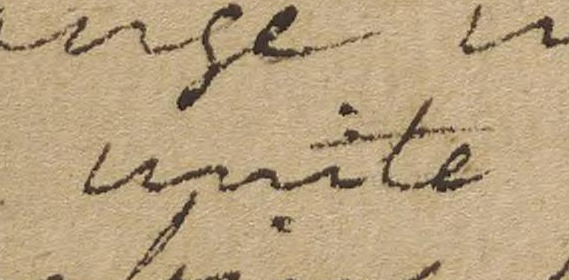unite
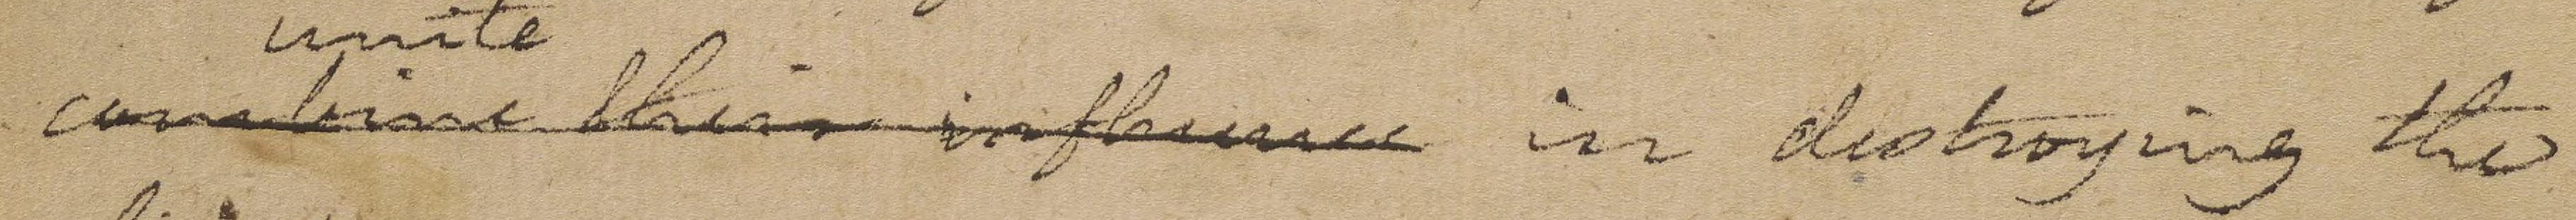[combine their influence] in destroying the
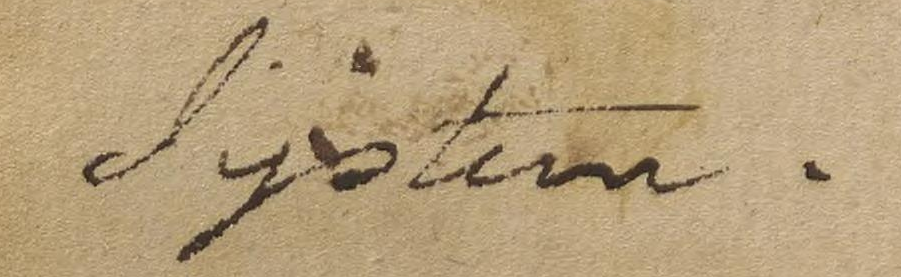System.
